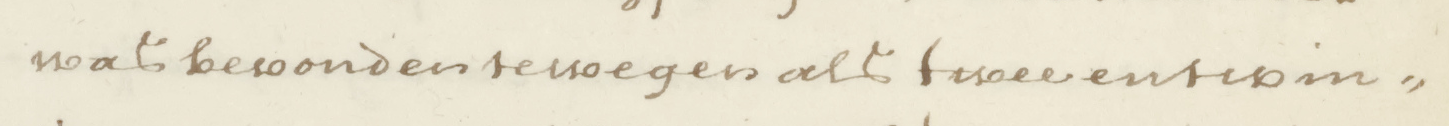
was bevonden te wegen als tweentwin„
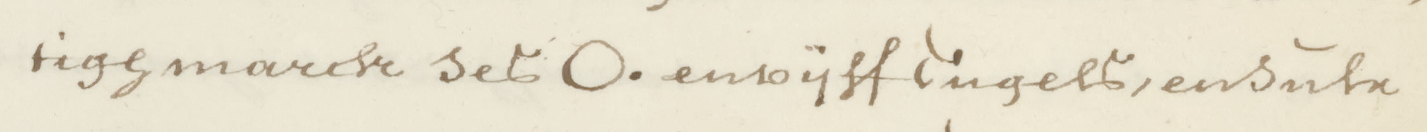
tigh marck ses O. en vijff Engels, en sulx
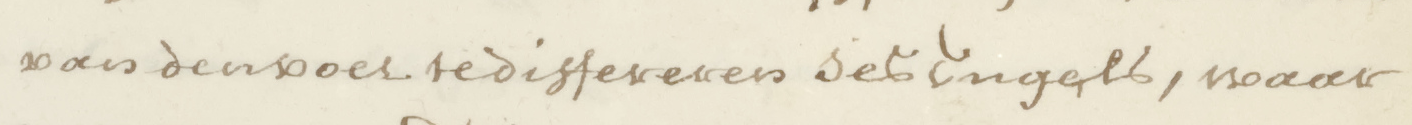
van den voet te differeren ses Engels, waar
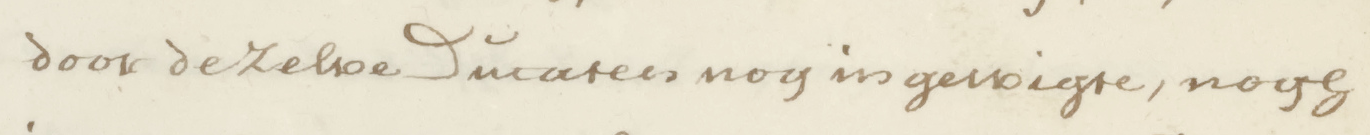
door dezelve Ducaten nog in gewigte, nogh
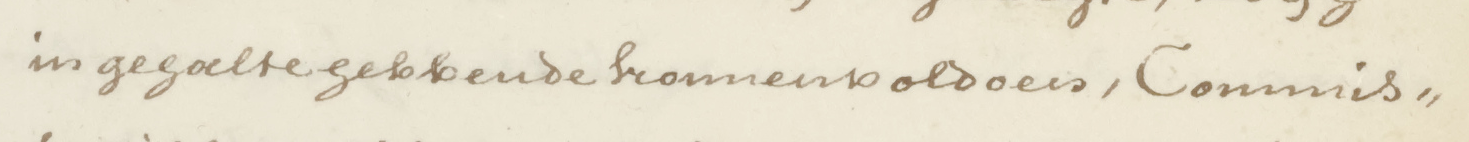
in gehalte hebbende konnen voldoen, Commis„
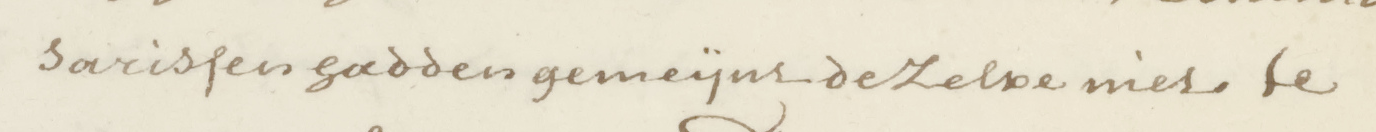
sarissen hadden gemeijnt dezelve niet te
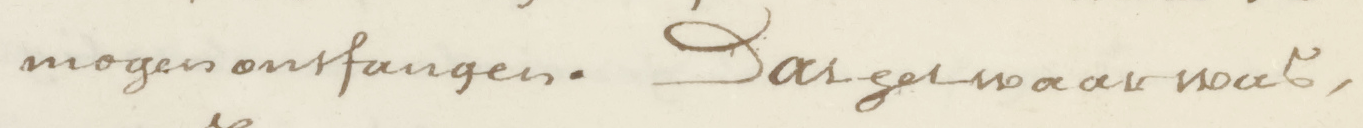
mogen ontfangen. Dat het waar was,
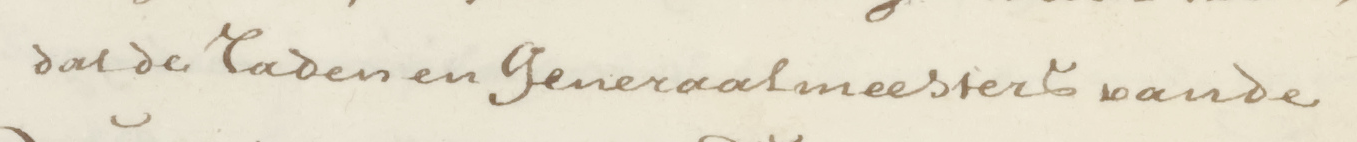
dat de Raden en Generaalmeesters vande
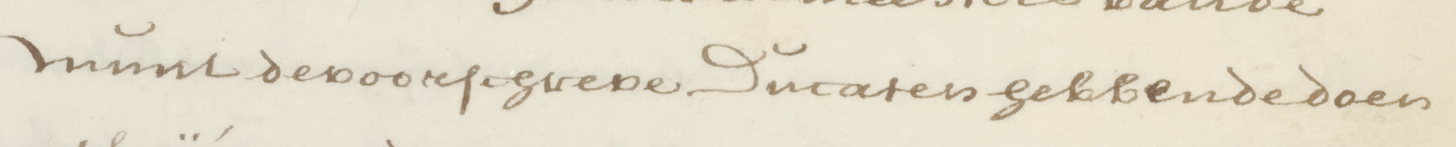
Munt de voorschreve Ducaten hebbende doen
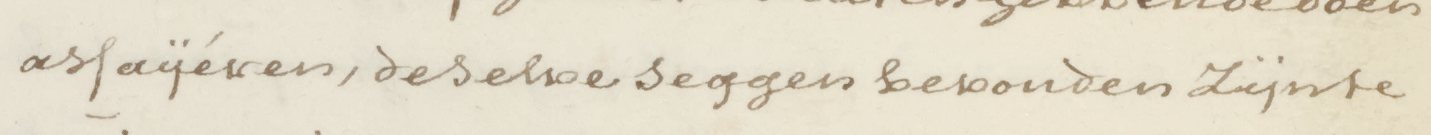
assaijeren, deselve seggen bevonden zijn te
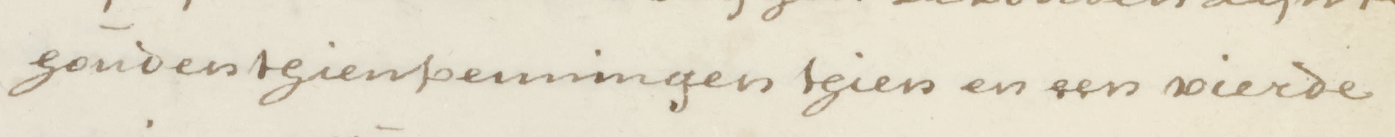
houden thien penningen thien en een vierde
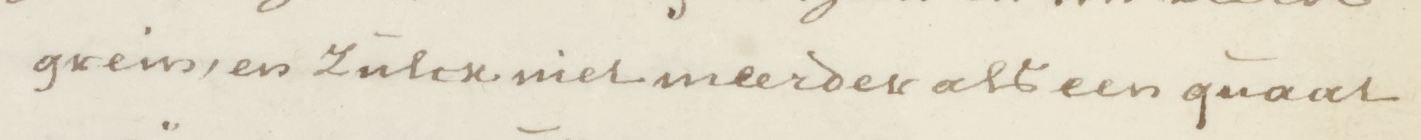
grein, en zulcx niet meerder als een quaat
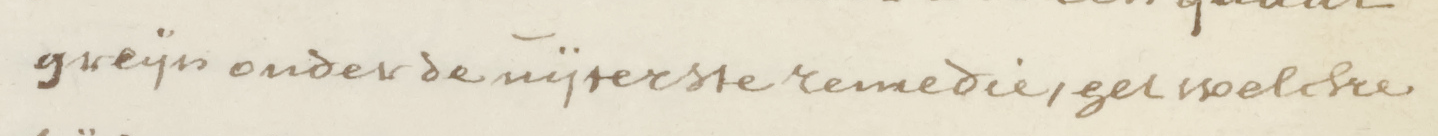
greijn onder de uijterste remedie, het welcke
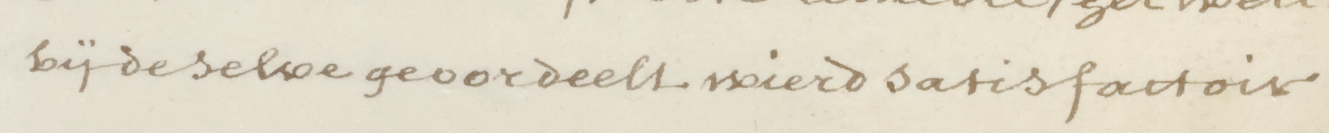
bij deselve geoordeelt wierd satisfactoir
